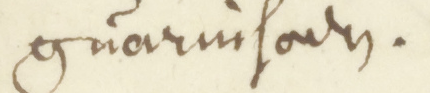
guarnisoen.
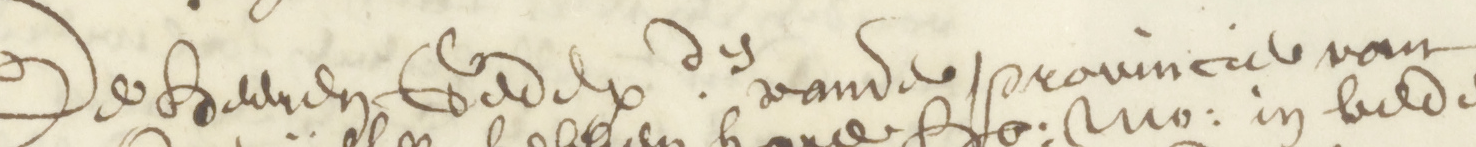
De Heeren Gedepden vande provincie van
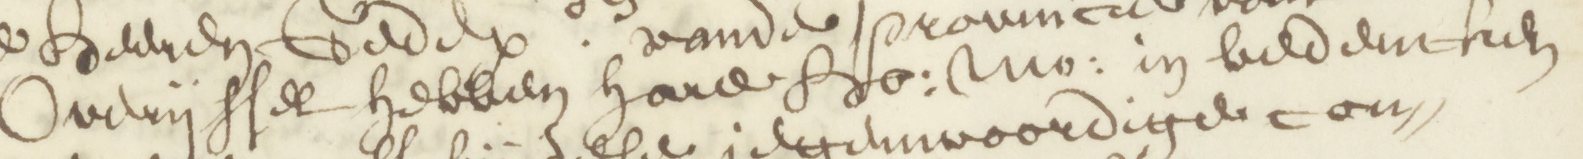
Overijssel hebben hare Ho:Mo: in bedencken
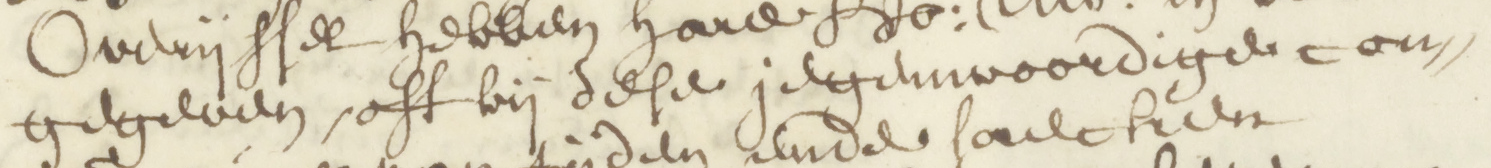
gegeven, off bij dese jegenwoordige con„
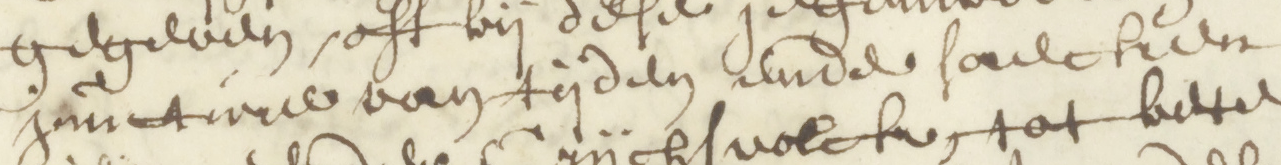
juncture van tijden ende saecken
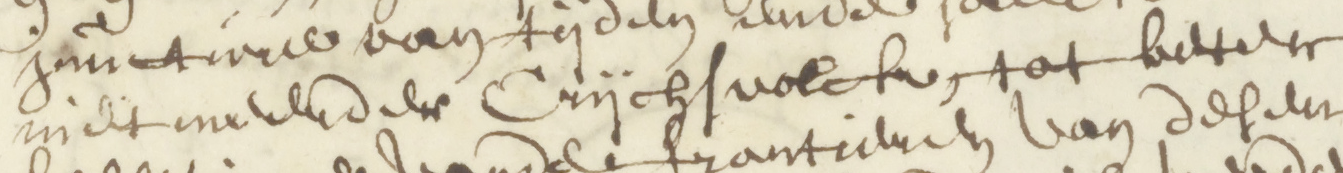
niet meerder Crijchsvolck, tot beter
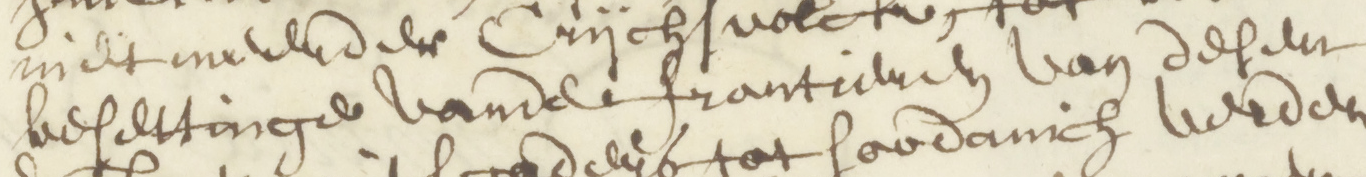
besettinge vande frontieren van desen
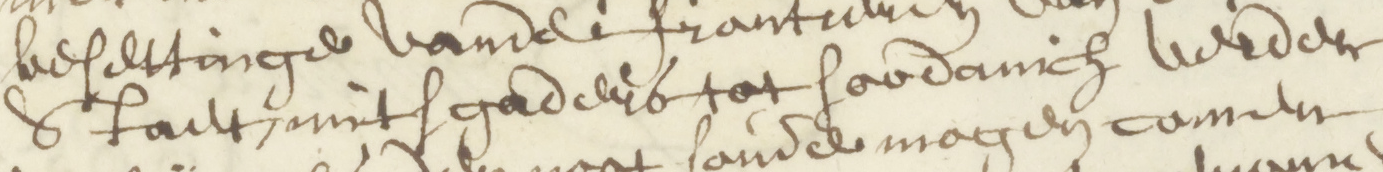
Staet, mitsgaders tot soodanich verder
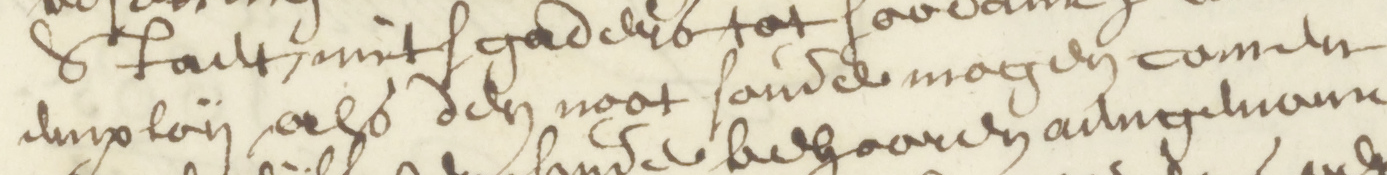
emploij als den noot soude mogen comen
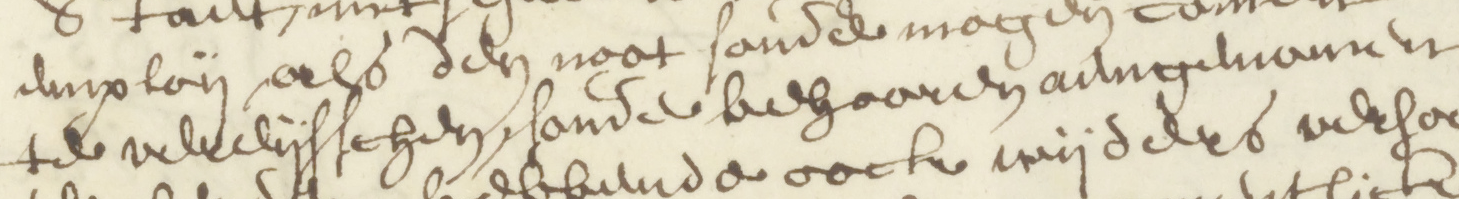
te vereijsschen, soude behooren aengenomen
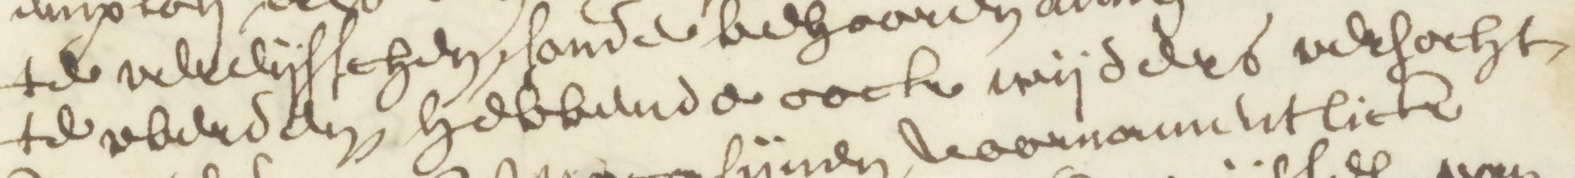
te werden, hebbende oock wijders versocht
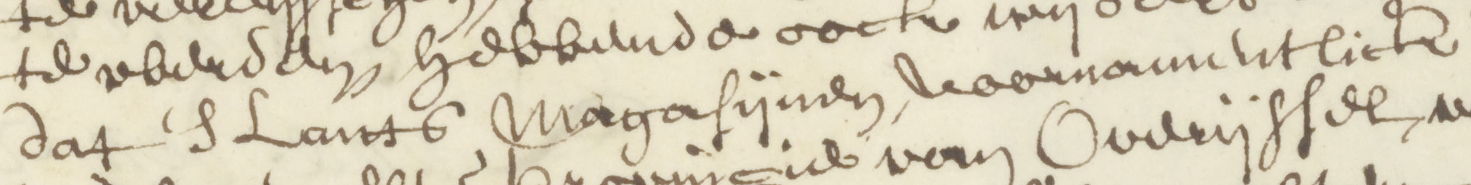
dat ‛sLants Magasijnen, voornamentlick
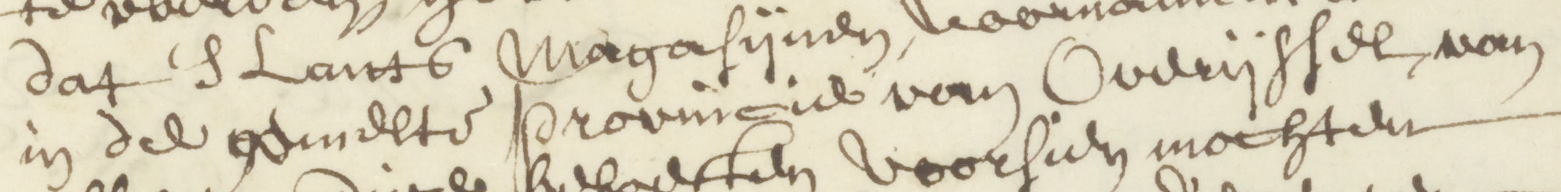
in de gemelte provincie van Overijssel, van
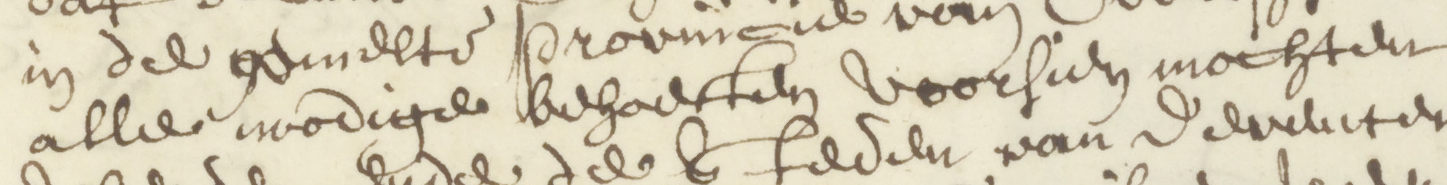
alle noodige behoeften voorsien mochten
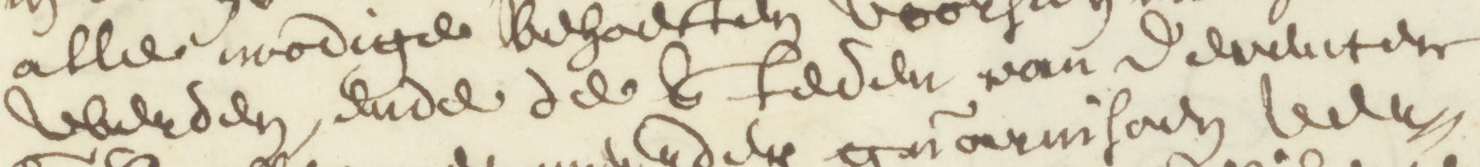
werden, ende de Steden van Deventer
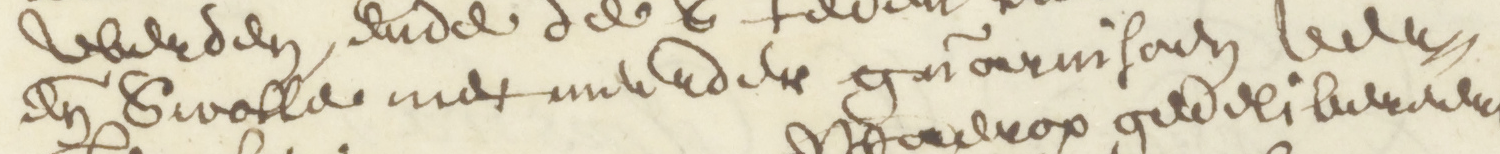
en Swolle met meerder guarnisoen ver„
